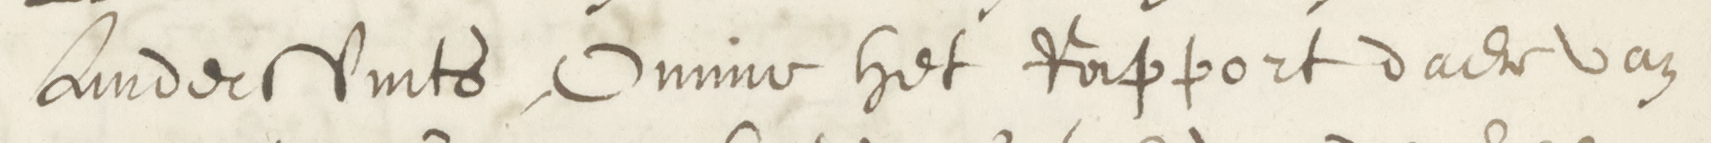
Anderssints, Omme het Rapport daervan
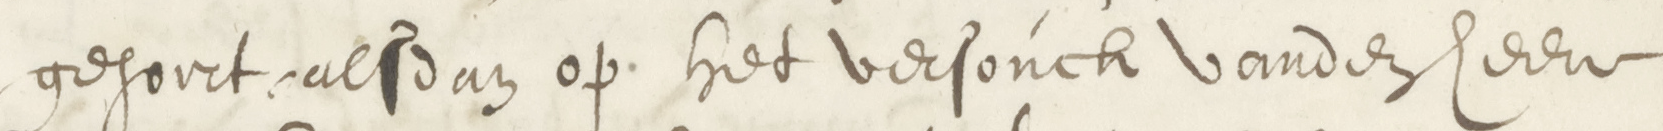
gehoirt, alsdan op het versouck vanden heere
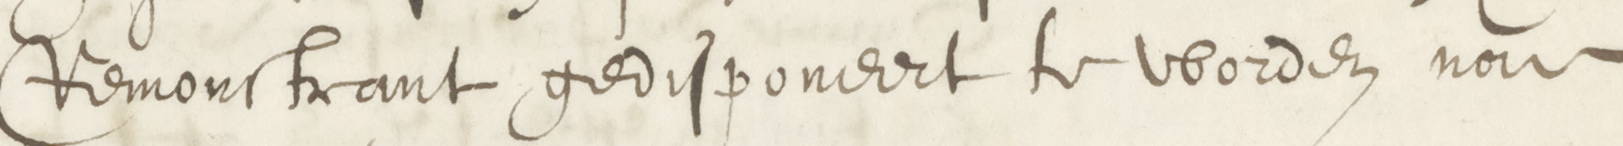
Remonstrant gedisponeert te worden nae
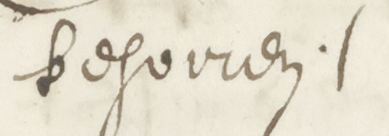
behoiren.
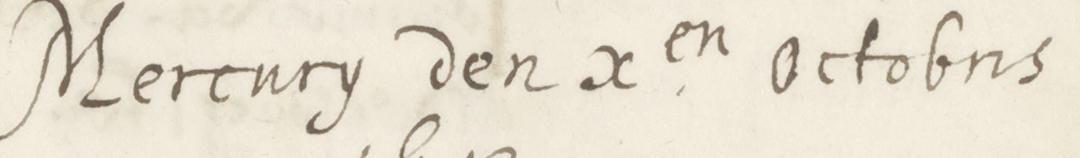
Mercury den xen. octobris
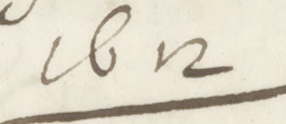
1612
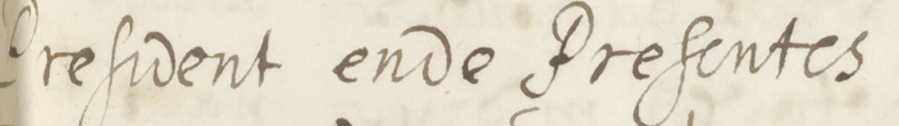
President ende Presentes
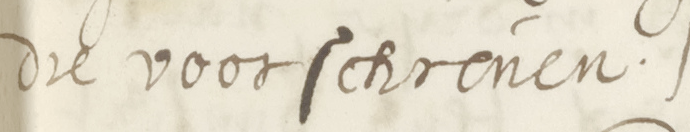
die voorschreuen
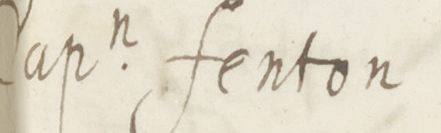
Capn. Fenton
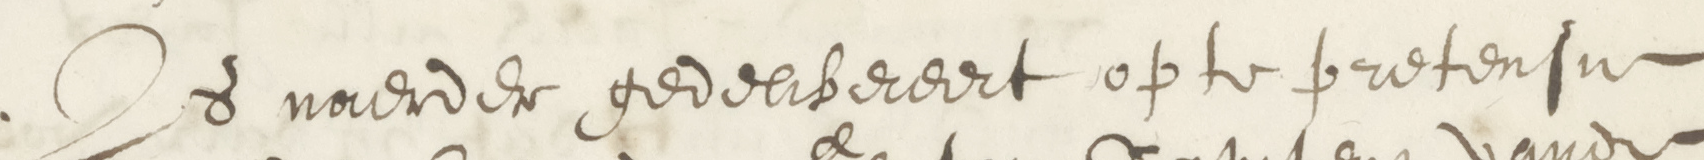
Is naerder gedelibereert opte pretensie
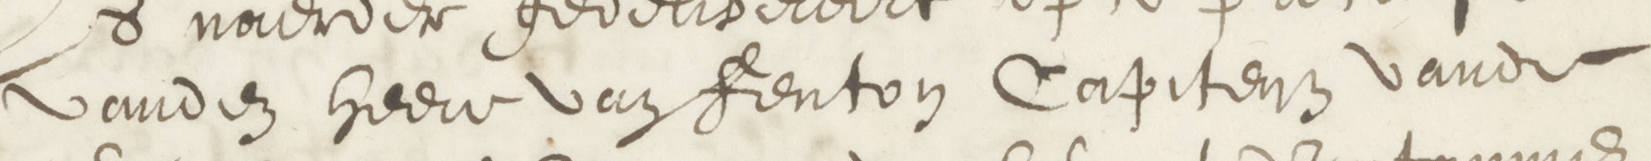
vanden heere van Fenton Capiteyn vande
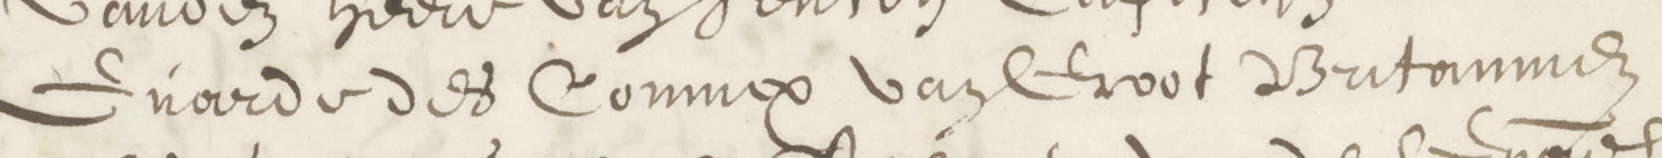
Guarde des Conincx van Groot Britannien
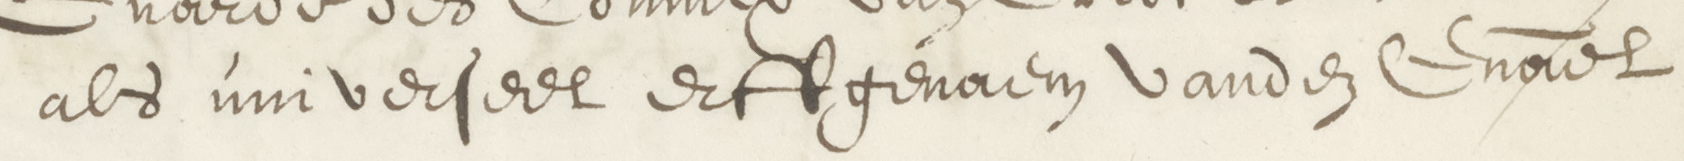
als universeel erffgenaem vanden Gnael
